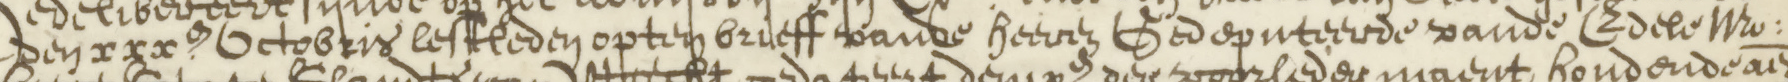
den xxxen. Octobris lestleden opten brieff vande heeren Gedeputeerde vande Edele Mo:
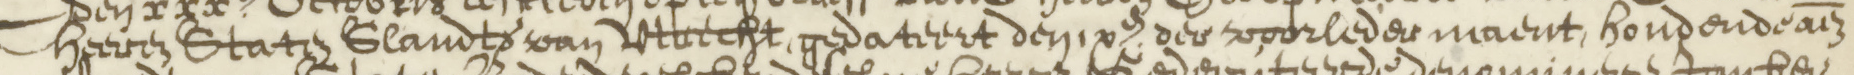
heeren Staten Slandts van Utrecht, gedateert den ixen. der voorleder maent, houdende aen
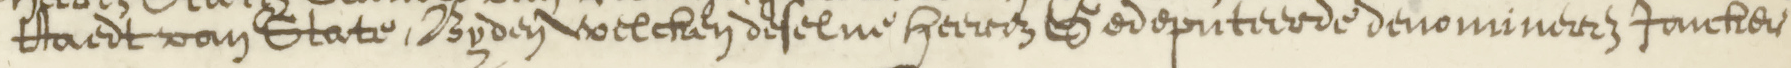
Raedt van State, Byden welcken deselue heeren Gedeputeerde denomineren Joncker
